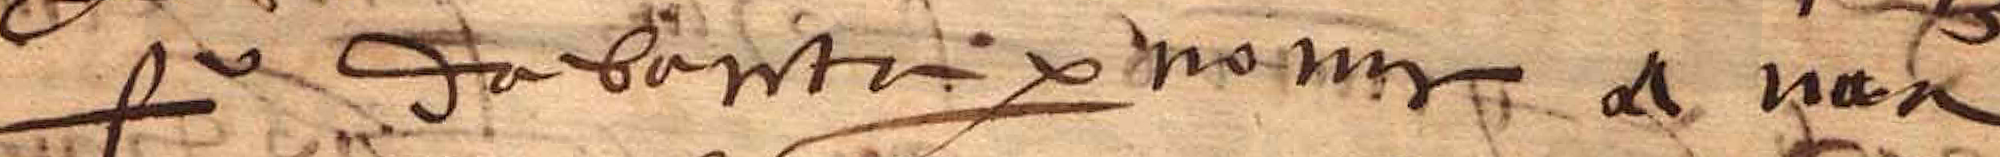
fo da bareta ꝑ nome anaa
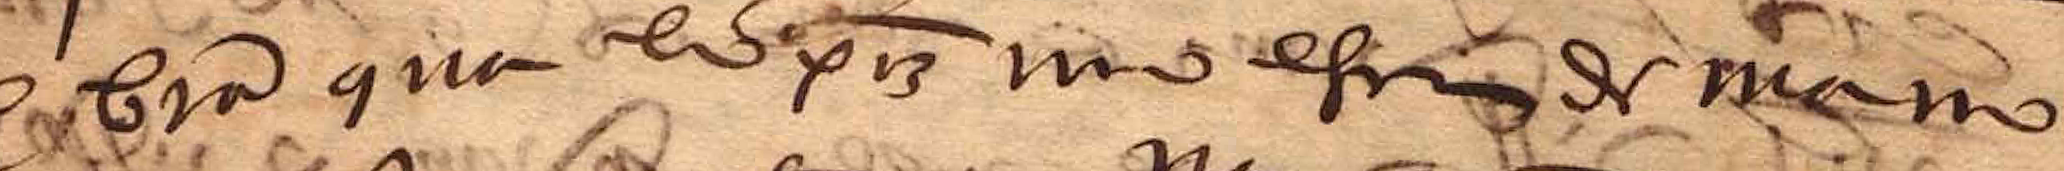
e brāqua lopiz molher de mano
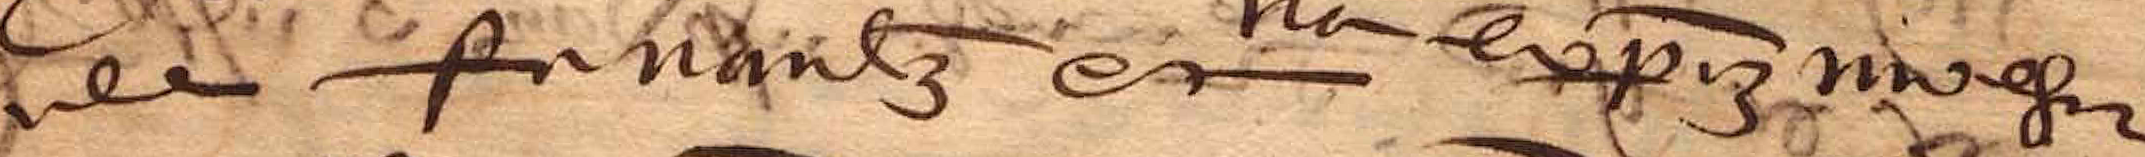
ell fernandez e cna lopiz molher
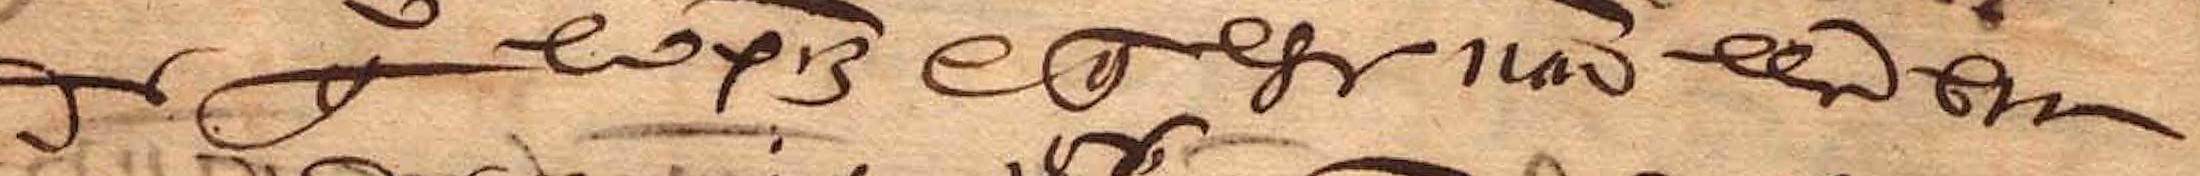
de go lopiz e q̄ lhe não llēbra
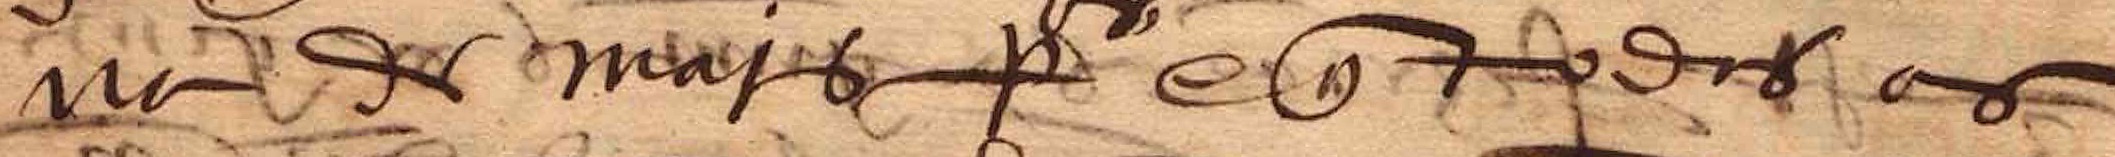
ua de majs pas e q̄ todas as
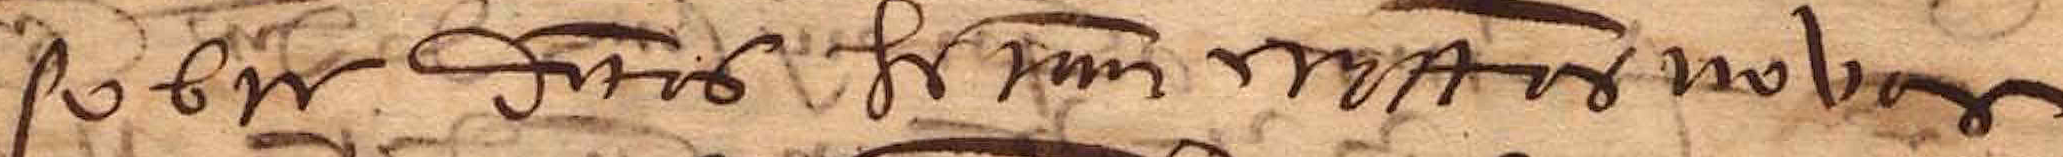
sobreditas heran crystās novas
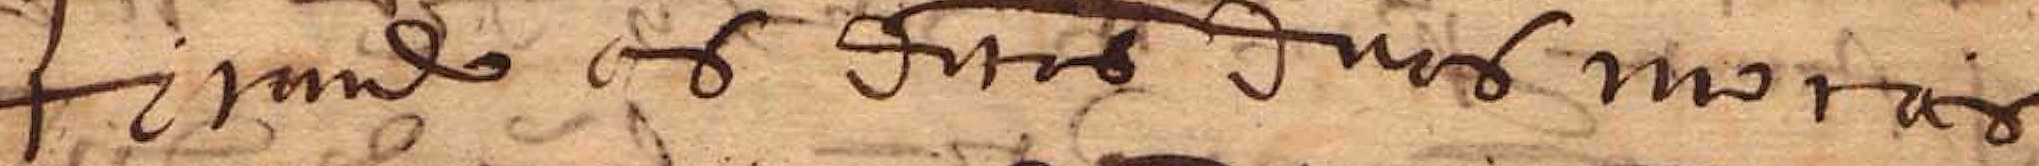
tyrando as ditas duas mocas
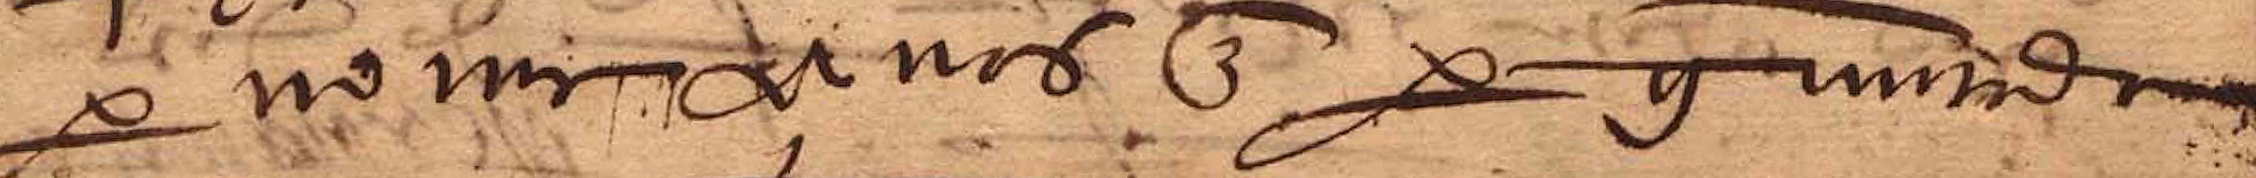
ꝑ nome Anas item ꝑguntada
